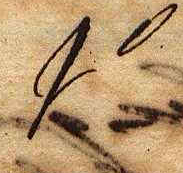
1o
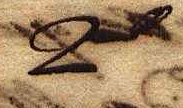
2o
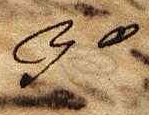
3o
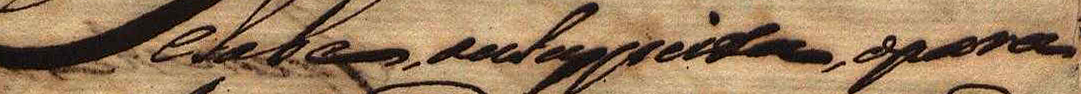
Se sabe, ou suspeita, o para
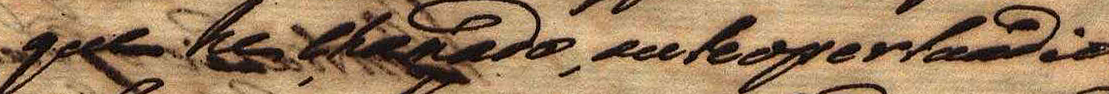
que he çhamado, ou se o persuadio
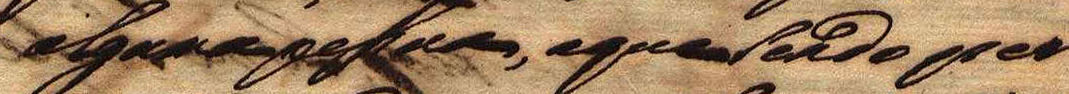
alguma pessoa, a que sendo per
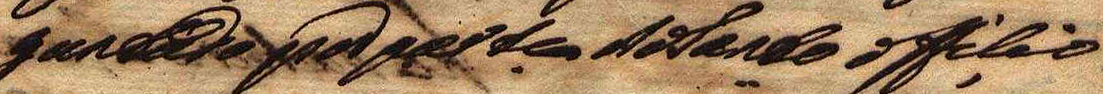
guntado por parte do Santo offiçio
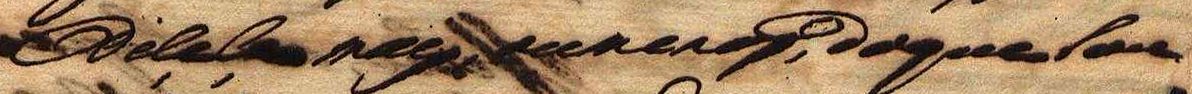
diçeçe maes, ou menos, do que sou
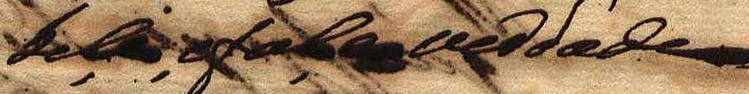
beçe, e foçe verdade
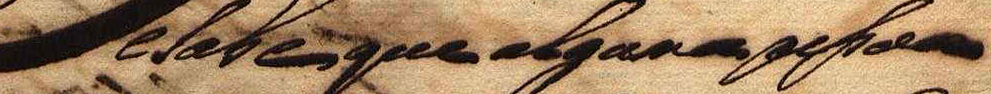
Se sabe que alguma pessoa
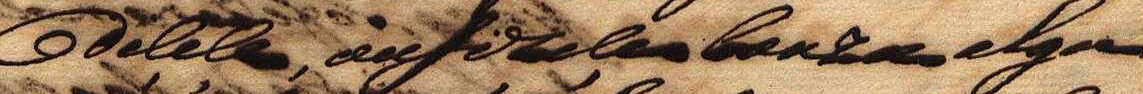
diçeçe, ou fizeçe Couza algu
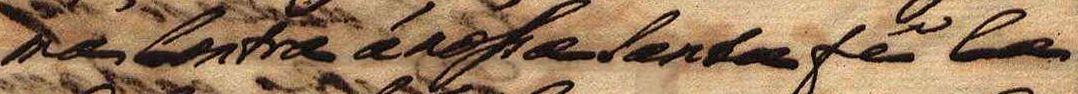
ma Contra á nossa santa fé Ca
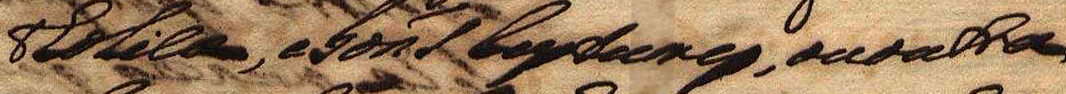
tholica, e boñs Custumes, ou outra
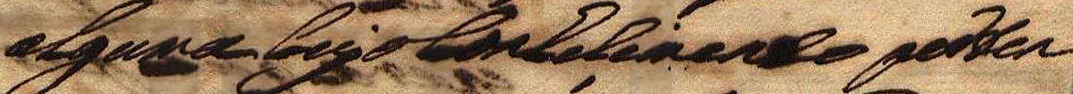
alguma Cujo Conheçimento perten
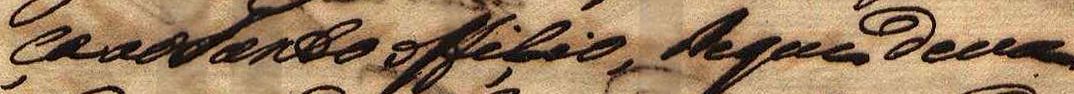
ça ao Santo offiÇio, de que deua
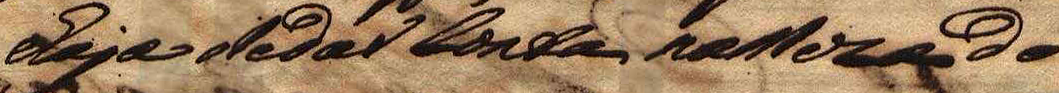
e haja de dar Conta na Meza do
